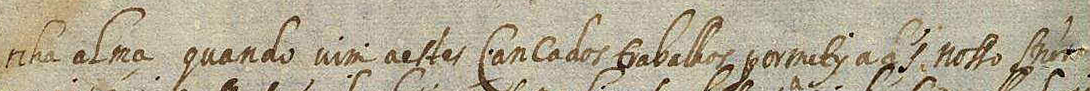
nha aLma, quando uim a estes CanCados trabalhos pormety a ds̄ nosso snōr
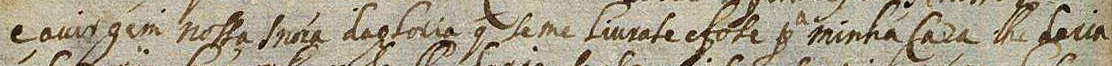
e a uirgem nossa snorā da gLoria q̄ se me Liurase e fose pa minha Caza lhe daria
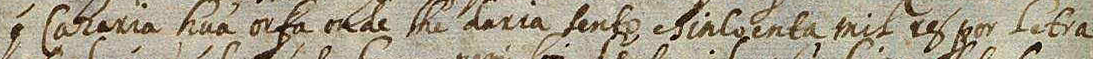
q̄ Cazaria huā orfa onde lhe daria sento e sinCoenta mil rs̄ por Letra
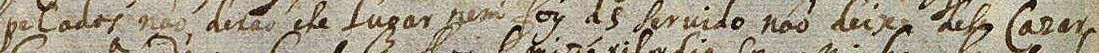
peCados naõ derão ele Lugar nem foy d̄s seruido naõ deixe de se Cazar
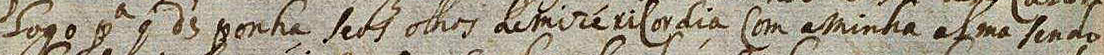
Logo pa q̄ ds̄ ponha seos olhos de mizériCordia com a minha aLma sendo
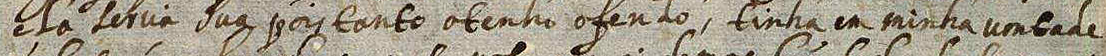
eLa serua sua pois tanto o tenho ofendo, tinha em minha uontade
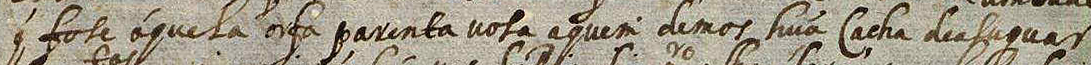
q̄ fose áquela orfa parenta uosa a quem demos huā Cacha de aLuguar
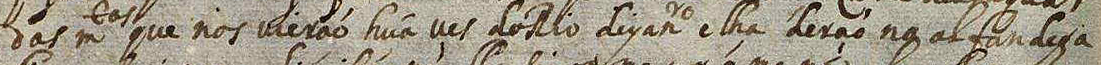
das mtas que nos uieraõ huā ues do Rio de yanro e lha deraõ na aLfandega
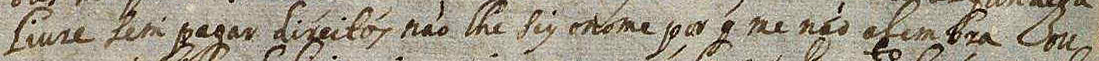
Liure sem pagar direitos naõ lhe sey o nome por q̄ me não alembra ou
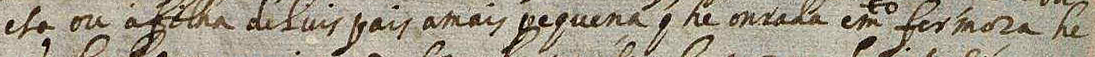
esa ou a filha de Luis pais a mais pequena q̄ he onrada e mto fermoza he
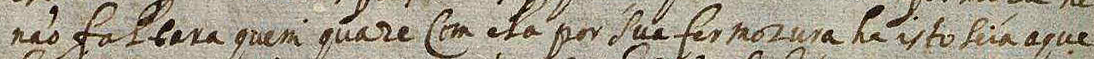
naõ faLtara quem quaze Com eLa por sua fermozura ha isto seia aque
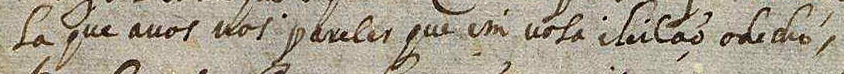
La que a uos uos pareCer que em uosa iLeiCaõ o decho /
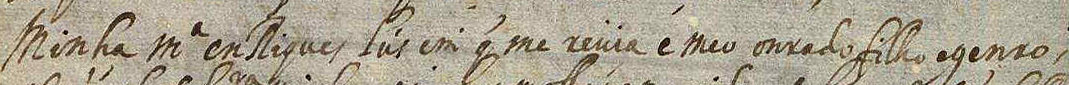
Minha ma enRiques Lus em q̄ me reuia e meo onrado filho e genro,
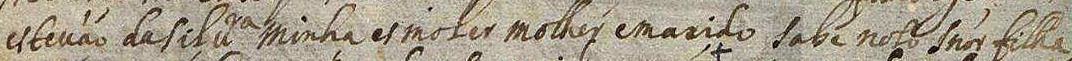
esteuaõ da siLura minha esmoLer molher e marido sabe noso Snōr filha
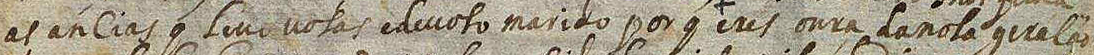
as áncias q̄ Leua uosas e de uoso marido porq̄ + cres onra da nosa geraCaõ
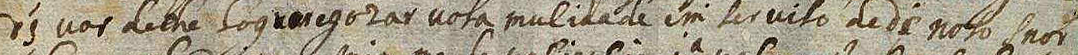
ds̄ uos deche Lograr e gozar uosa muCidade em seruiso de ds̄ noso snor̄
